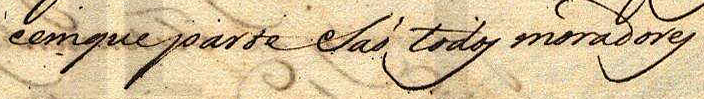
e em que parte Saõ todos moradores
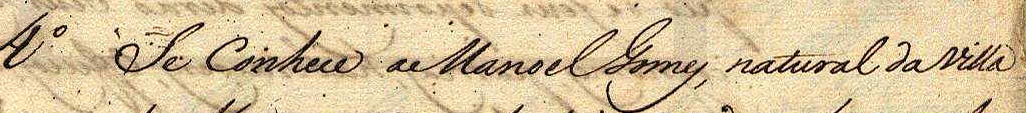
4.o Se Conhece a Manoel Gomes, natural da Villa
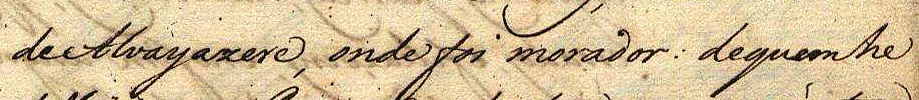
de Alvayazere, onde foi morador: de quem he
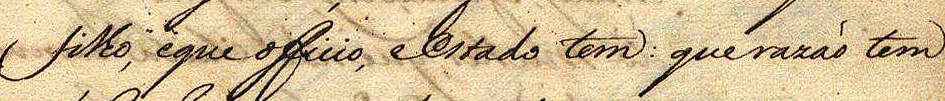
filho, e que officio, e Estado tem: que razaõ tem
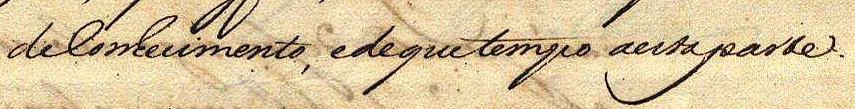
de Conhecimento, e de que tempo a esta parte.
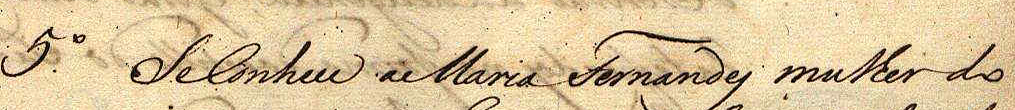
5.o Se Conhece a Maria Fernandes mulher do
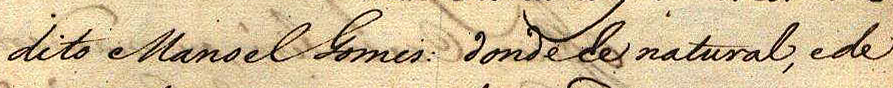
dito Manoel Gomes: donde he natural, e de
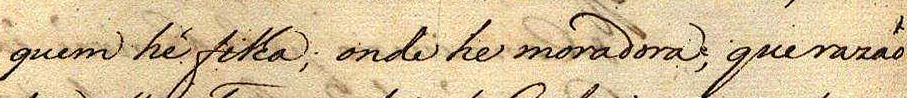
quem hé filha; onde he moradora, que razaõ
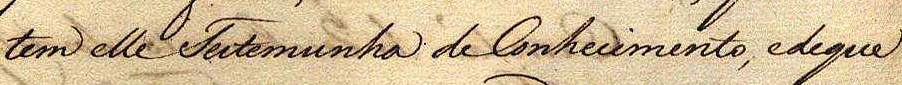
tem elle Testemunha de Conhecimento, e de que
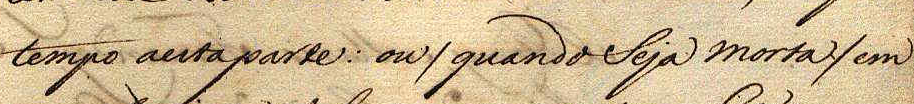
tempo a esta parte: ou/quando Seja morta/ em
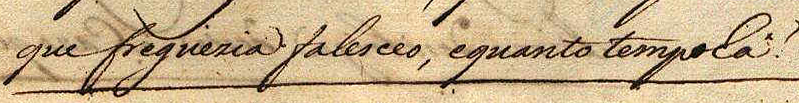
que freguezia falesceo, e quanto tempo há?
